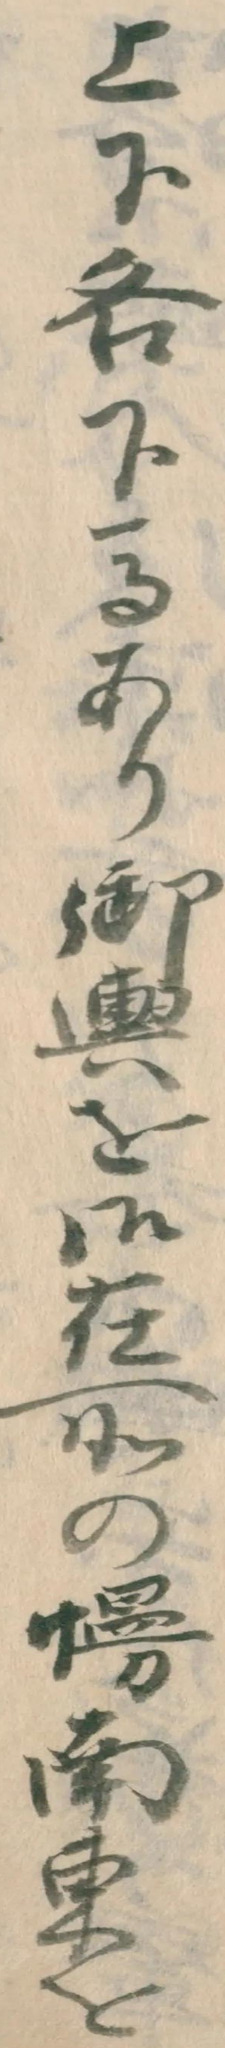上下各下馬あり御輿は御在所の幔南東を

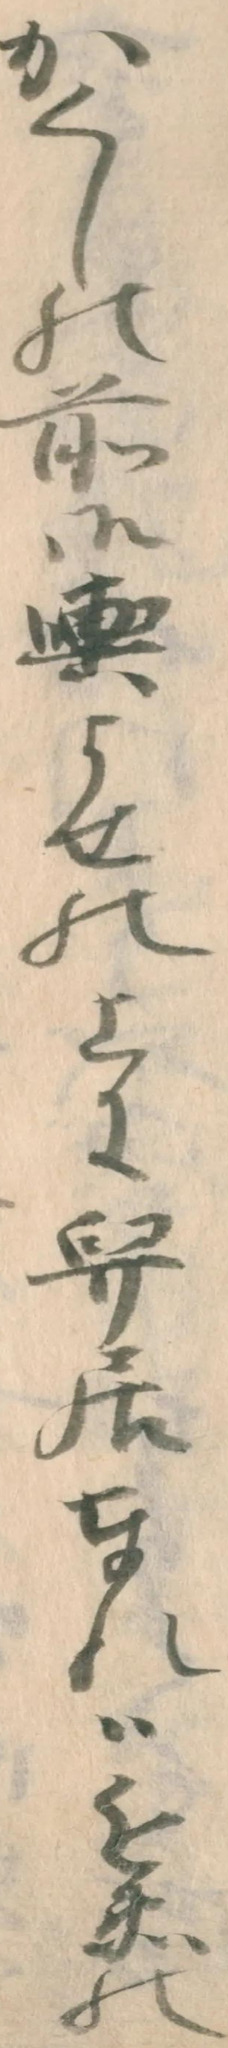かくしの前御輿よせの上に舁居奉れは近衛の
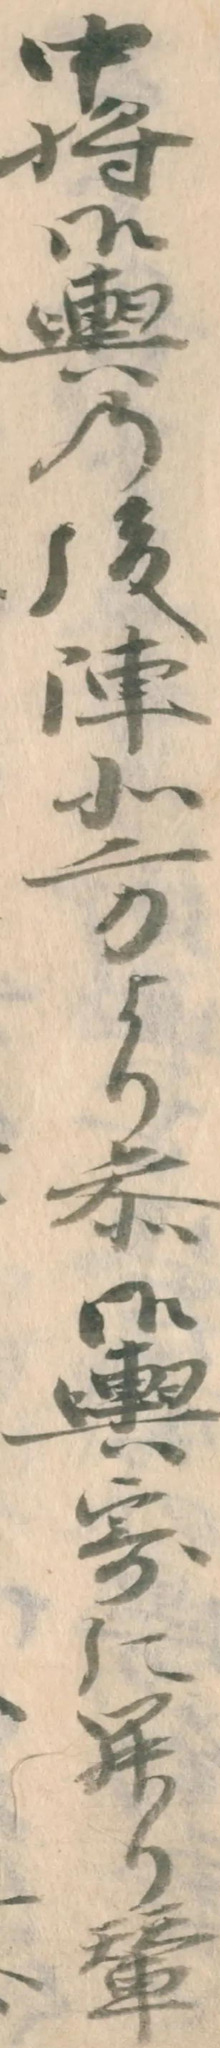中将御輿の後陣北方より参御輿寄に昇り輦
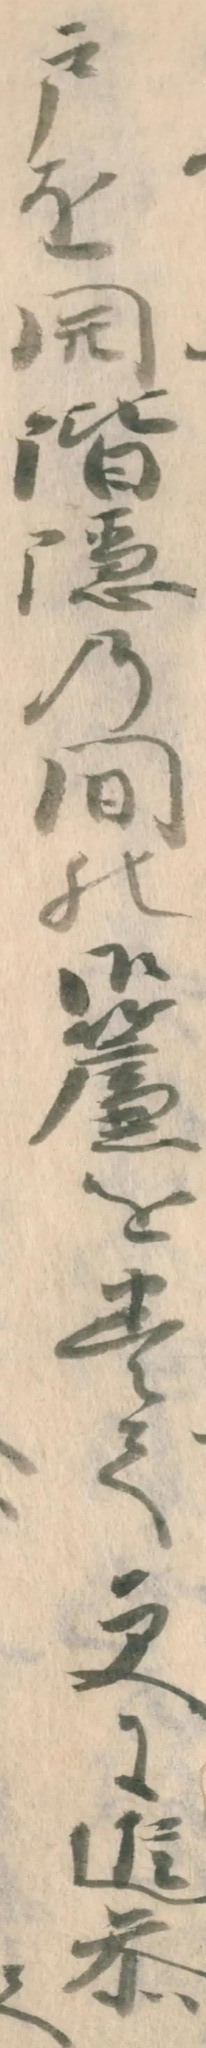戸を開階隠の間の御簾を巻て更に近参て
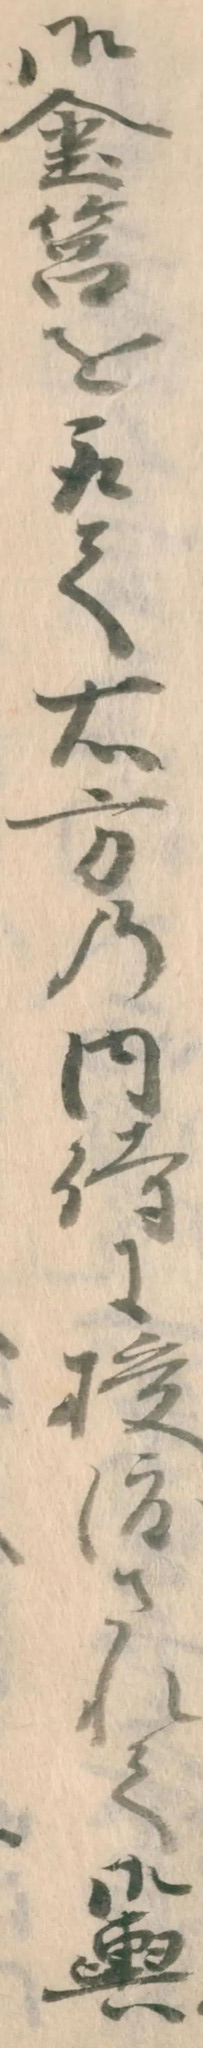御璽筥を取て右方の内侍に授渡されて御輿
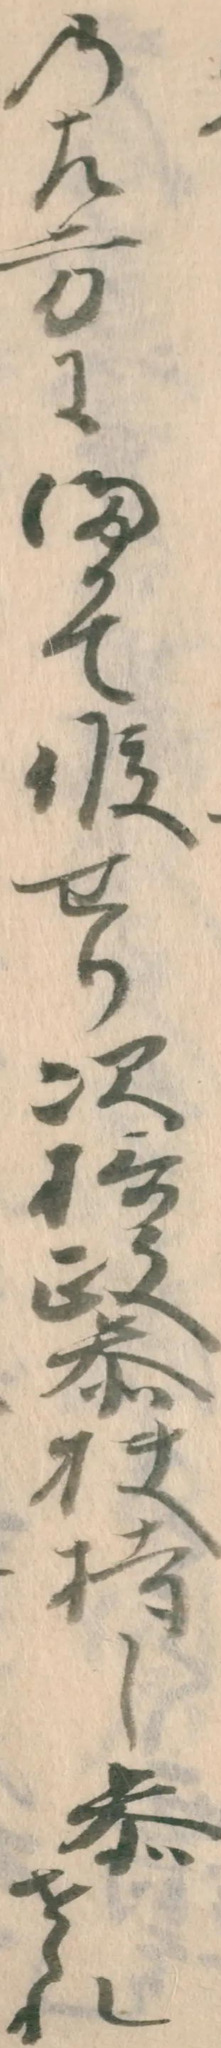の左方にまかて候せり次摂政参扶持し参せられ
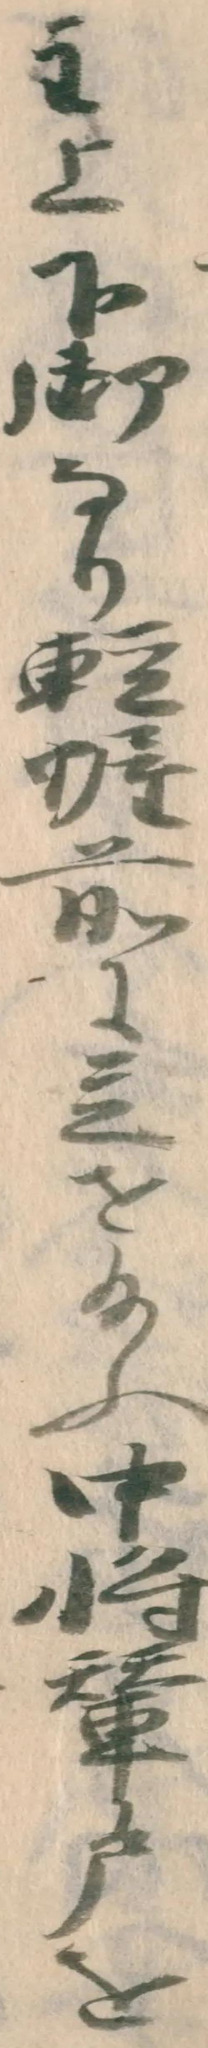主上下御なり軽幄前に立せ給ふ中将輦戸を
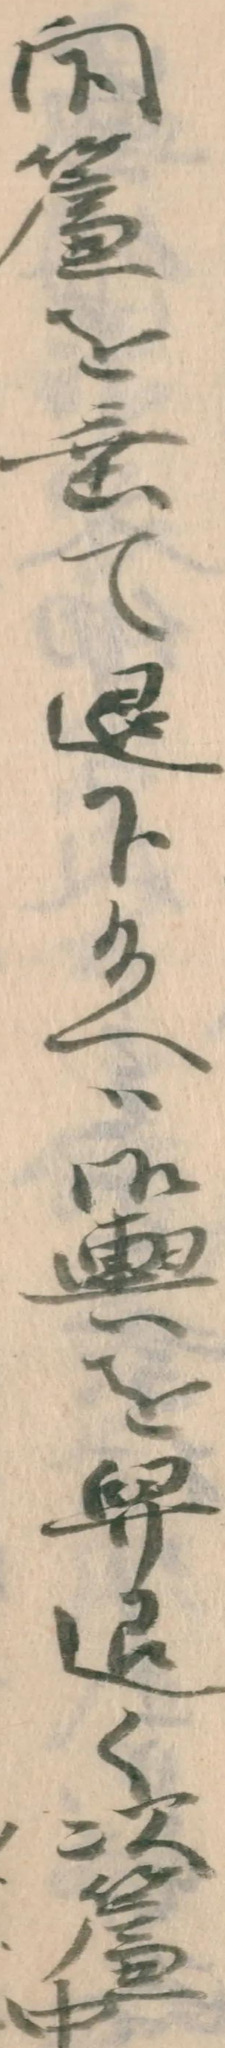閇簾を垂て退下給へは御輿を舁退く次簾中
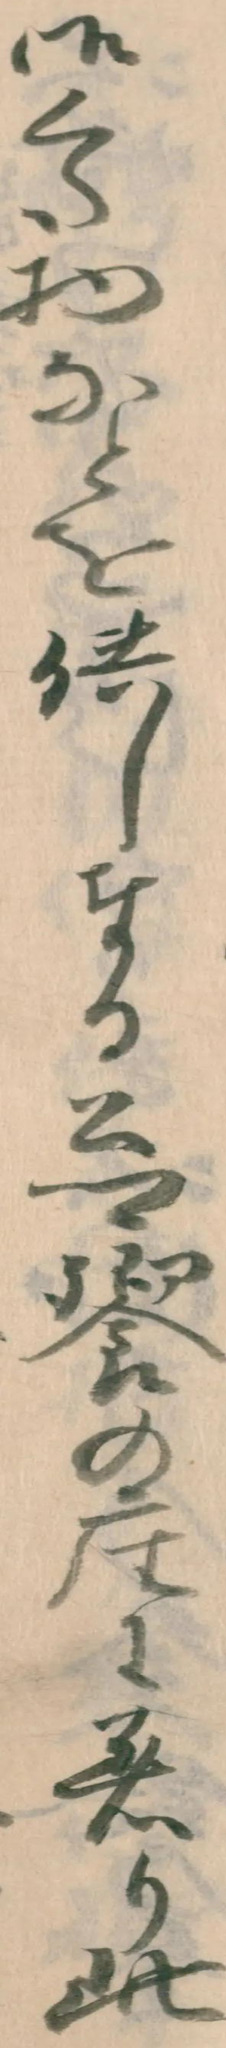御くた物なとを供し奉る公卿饗の座に着り此
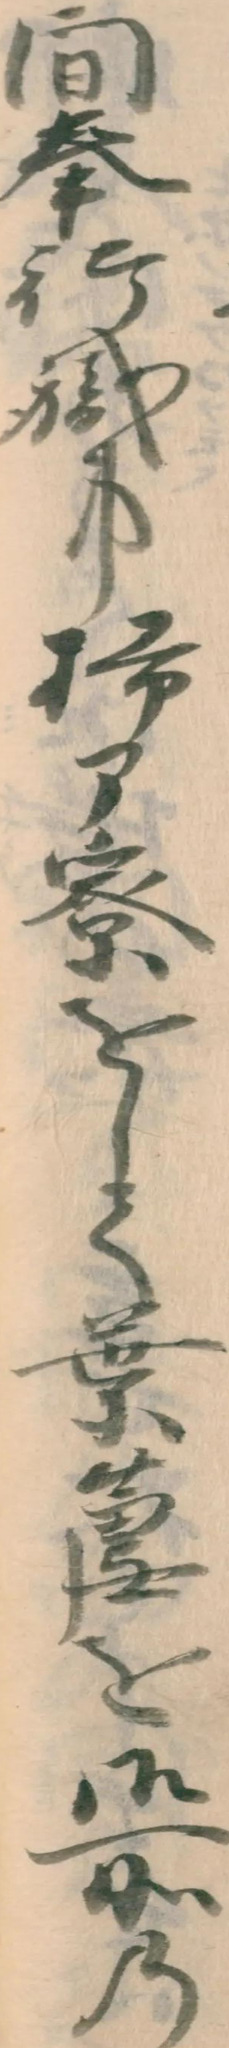間奉行職事掃部寮をして葉薦を御所の
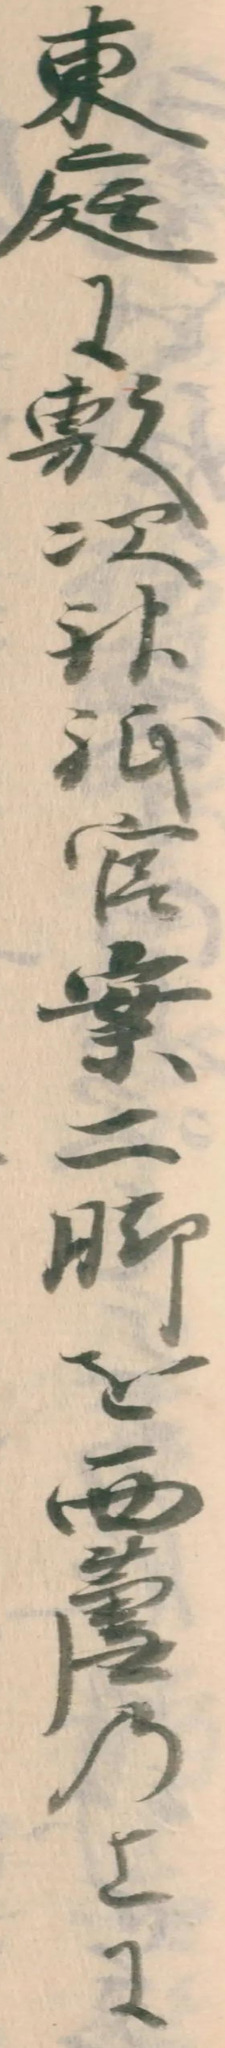東庭に敷次神祇官案二脚を西薦の上に
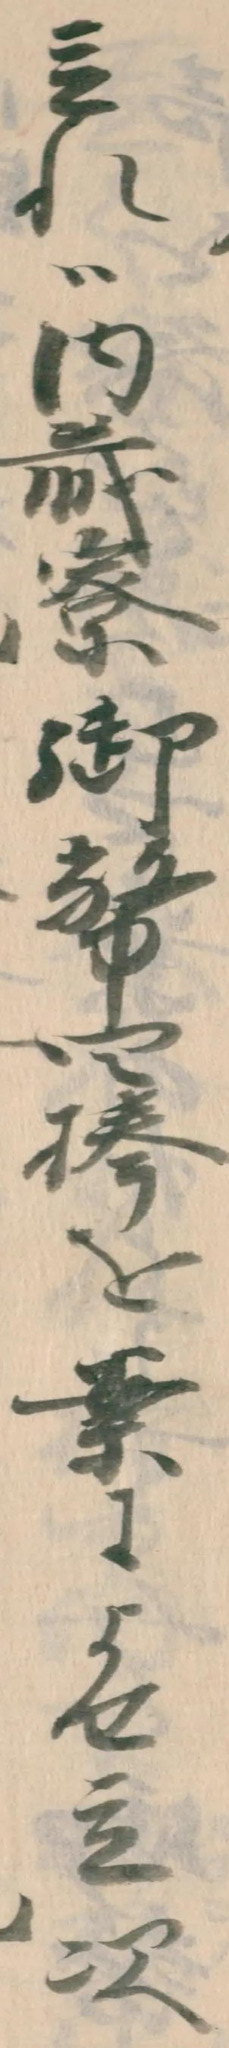立れは内蔵寮御幣四棒を案によせ立次
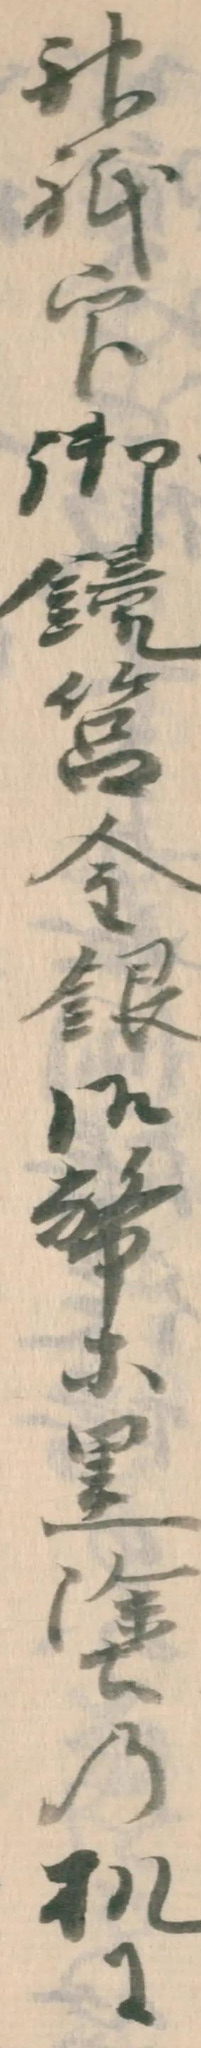神祇官御鏡筥金銀御幣等黒塗の机に
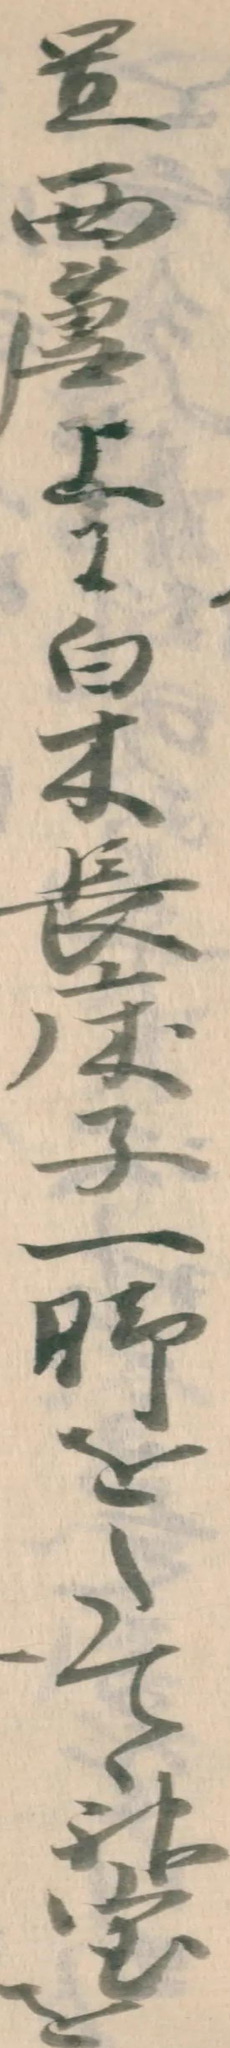置西薦上に白木長床子一脚をたてゝ神宝を
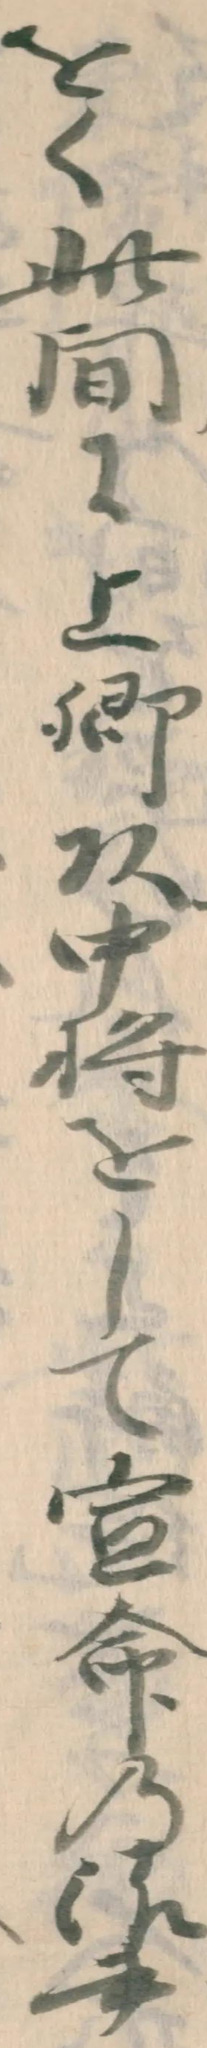をく此間に上卿頭中将をして宣命の清書
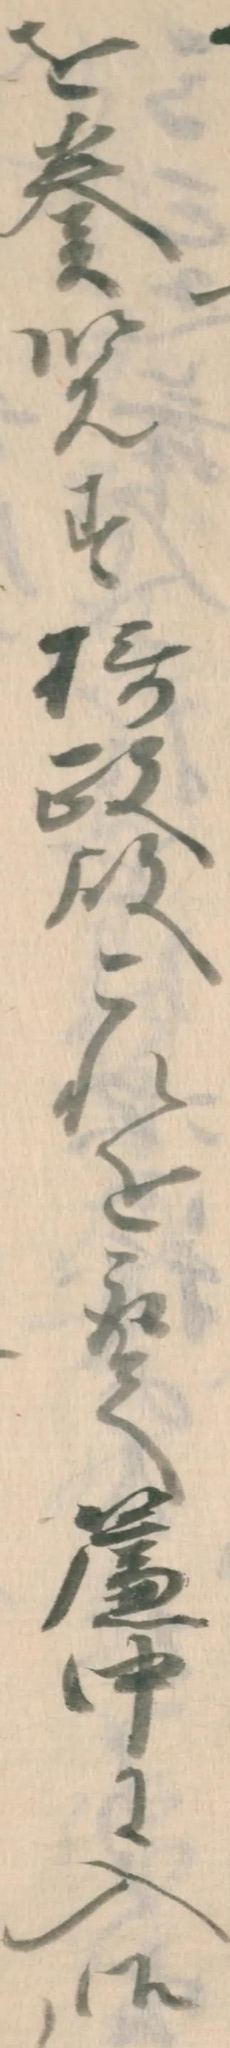を奏覧す摂政殿これを取て簾中に入御-
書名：賀茂社記録. 第1冊
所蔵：国立国会図書館 National Diet Library, JAPAN
